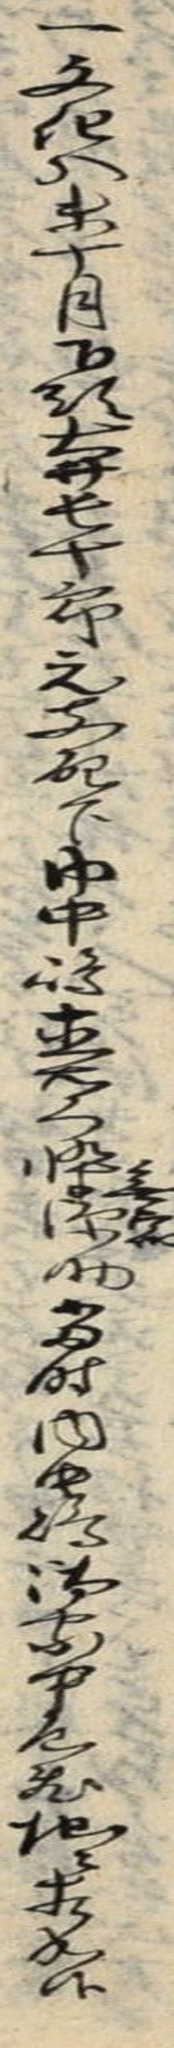一文化八未十月下領大井長十郎元支配下内中島直左衛門悴◦無宿源助当時内中島御家中屋敷地に相成候
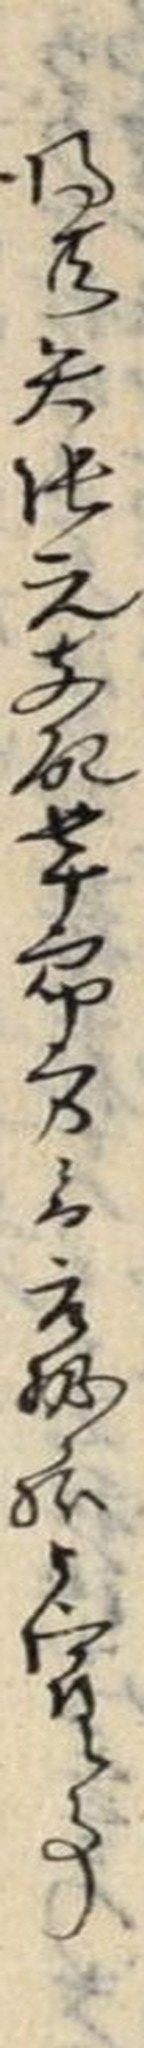得共矢張元支配長十郎方にて取扱候様被仰付候事
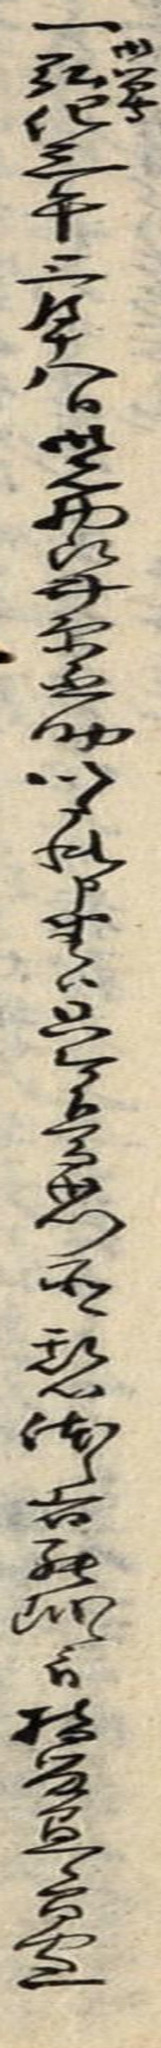一弘化御留守三午三月十八日御先物頭井原丞助以手紙申聞候は只今下馬御門所へ乱心体之者罷越候に付指留置候間宜
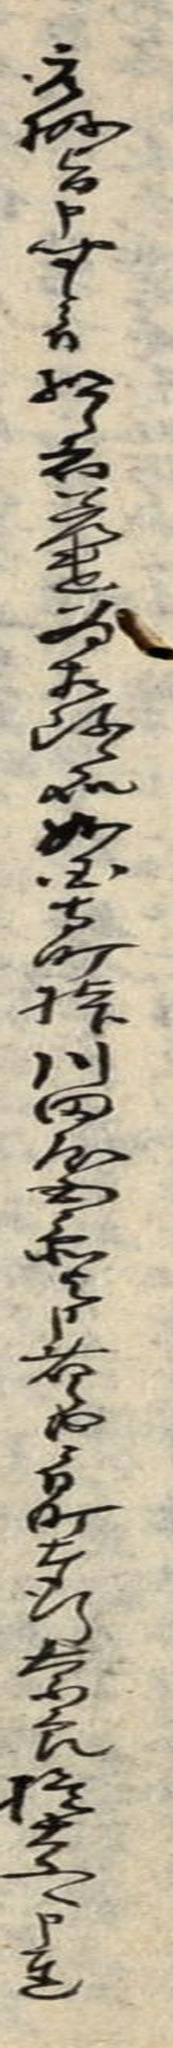取扱旨申聞候に付組之者差遣為相改候処妙国寺町挊川田屋五兵衛と申者之由に付町奉行奈良権大夫へ申達
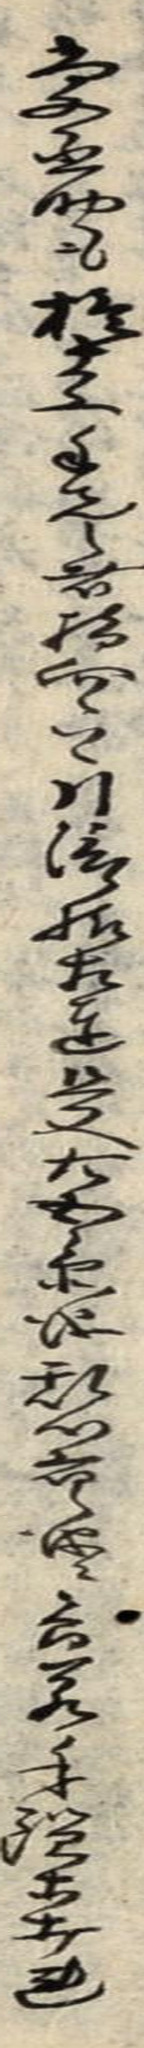尚又丞助へも権大夫手先之者指向候はゝ引渡候様相達且又右五兵衛儀乱心者之儀に候間若手鎖等打連
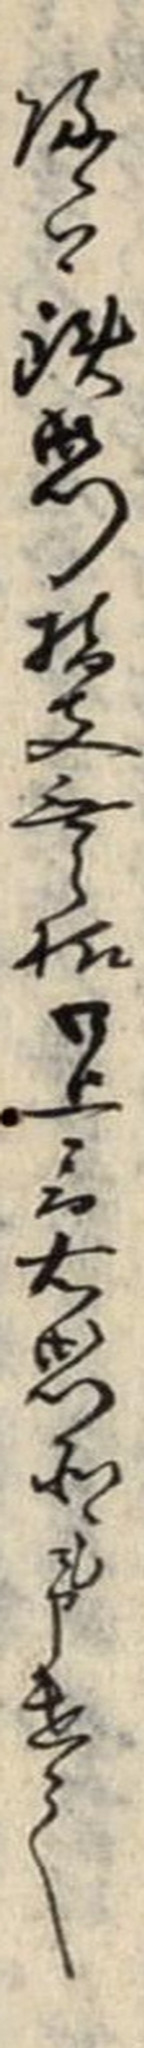帰候はゝ鉄御門指支無之様口上にて右御門所へも申遣之
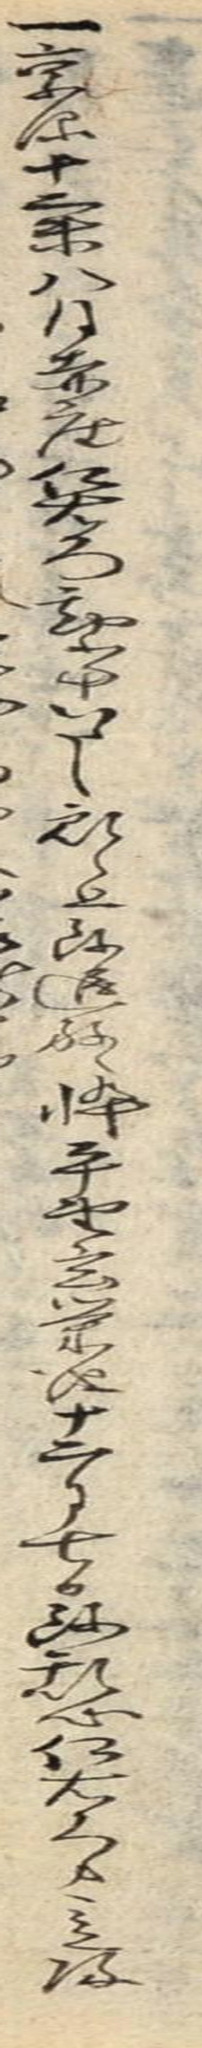一享保十二未八月赤座仁右衛門勘当いたし願之上致追放候悴平野玄栄儀十二月七日致乱心仁右衛門へ立帰
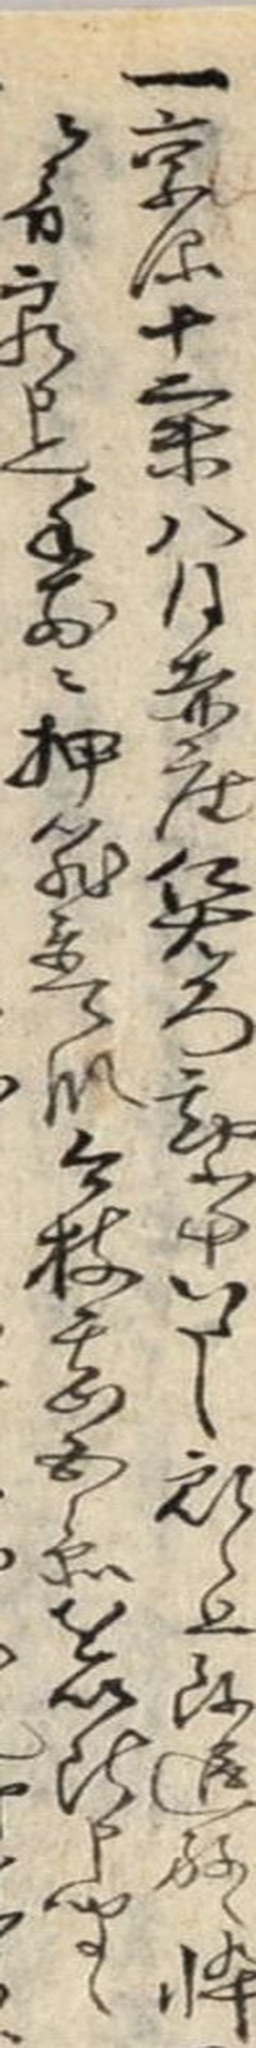候に付願申上手前に押籠置候段今枝甚五兵衛を以断申聞候
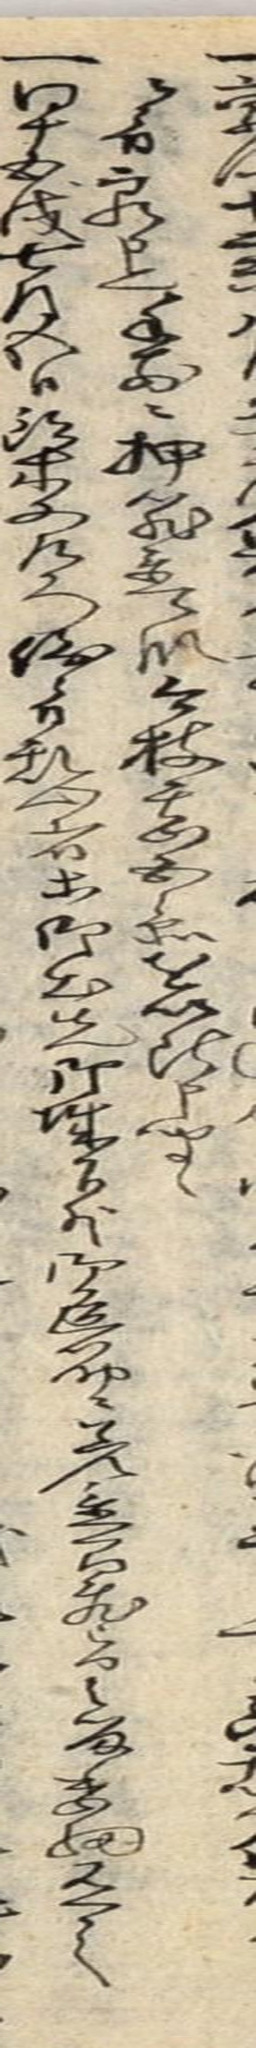一同十五戌七月八日鈴木又左衛門儀に付乱心者等御出先御城下外御道筋に差置間敷旨之留委細有之
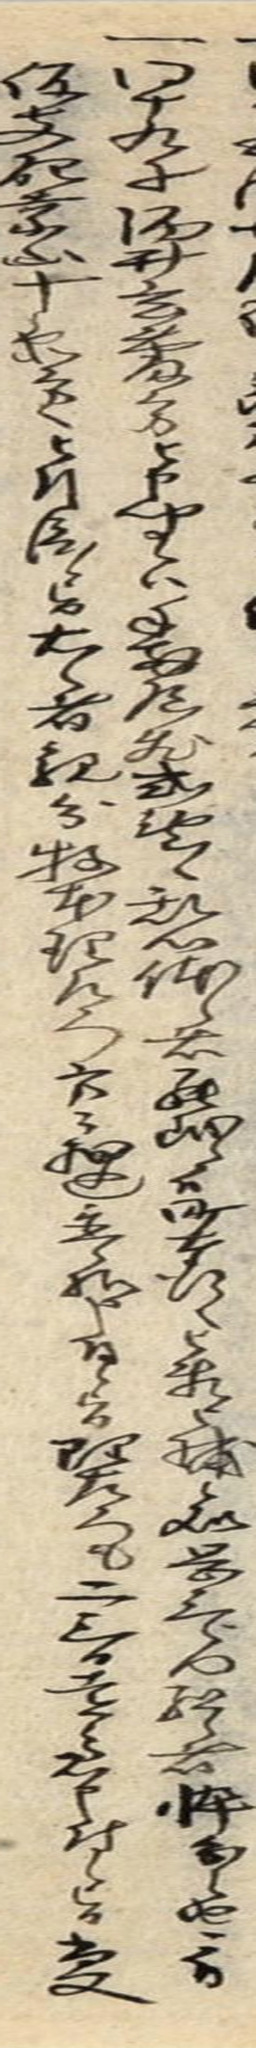仮支配桑山十兵衛方へ被引渡候旨右之者親分牧本理左衛門方に押込置候様申付候旨理左衛門も二三日遠慮申付候旨尚又
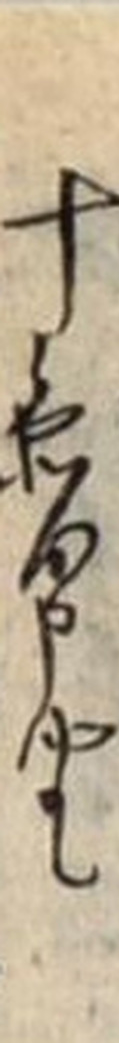十兵衛ゟ申聞候
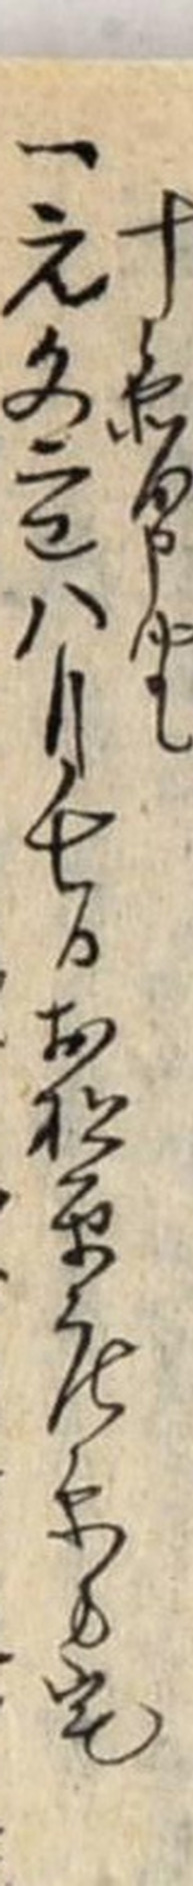一元文二巳八月七日於松平庄兵衛方宅
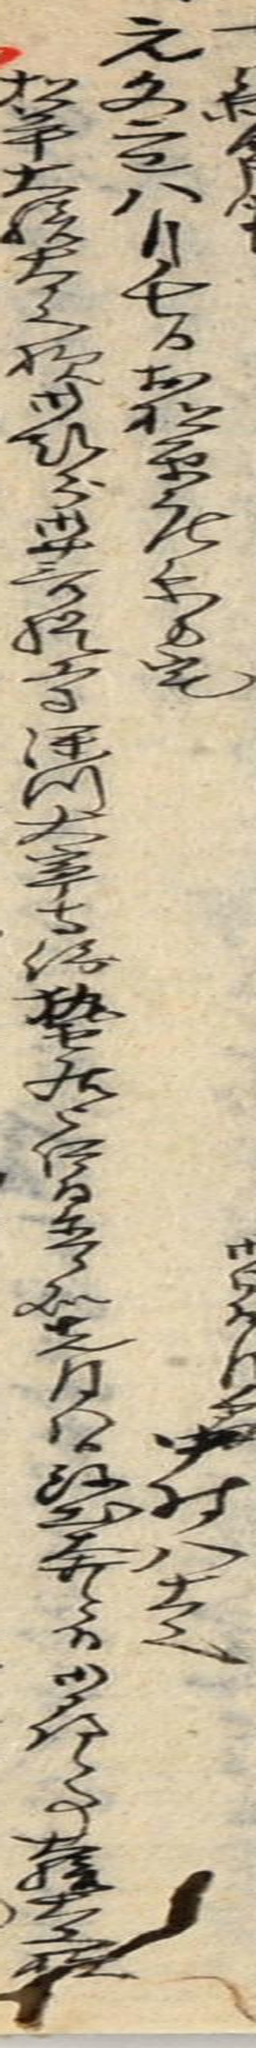松平大膳大夫様御領分御菩提寺深川大寧寺儀蟄居被仰付置候処先月八日致出奔候に付御尋之事大膳大夫様
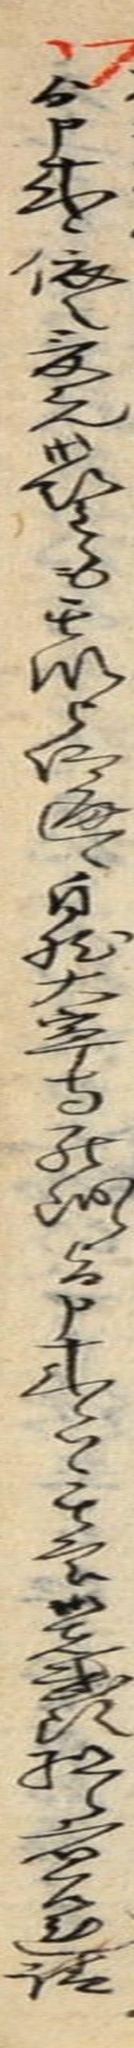ゟ申来候依之爰元御領主へも其段被仰通候自然大寧寺罷越候旨申来候はゝ其節御先武頭組之者召連請

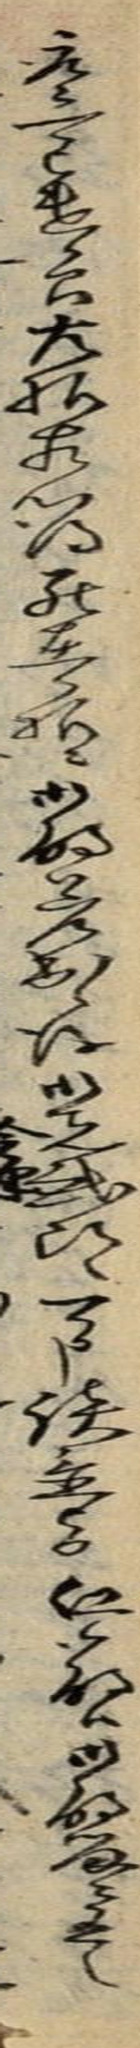取に可被遣候間左様相心得罷在候様に御触差出候後御先武頭へ可申談置旨但御触は御触留に有之
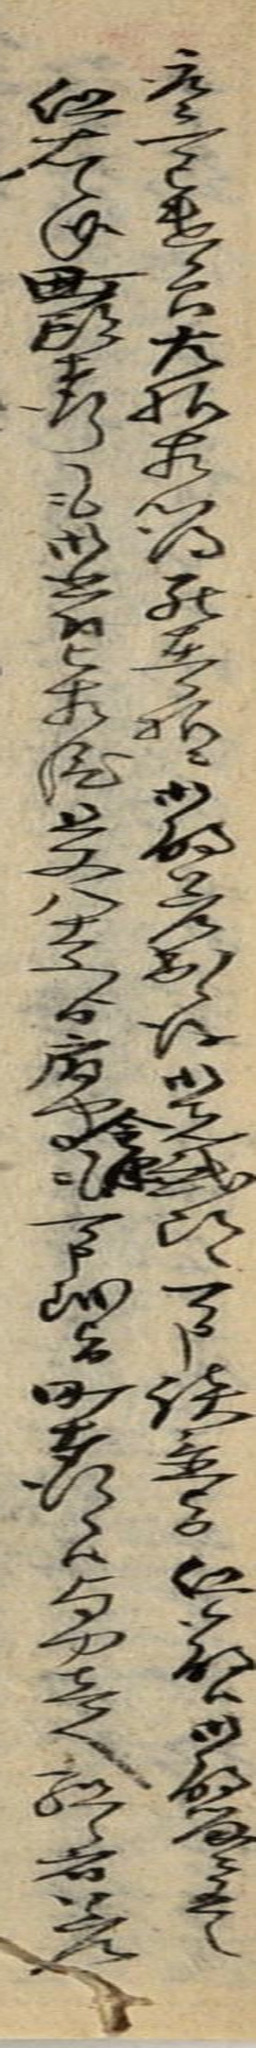但右之趣町郡奉行へも御書付被相渡且又八大夫ゟ府中◦へ金津も可申越旨町奉行へは与力壱人組之者差
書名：御停止異変死失
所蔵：福井県文書館 Fukui Prefectural Archives
